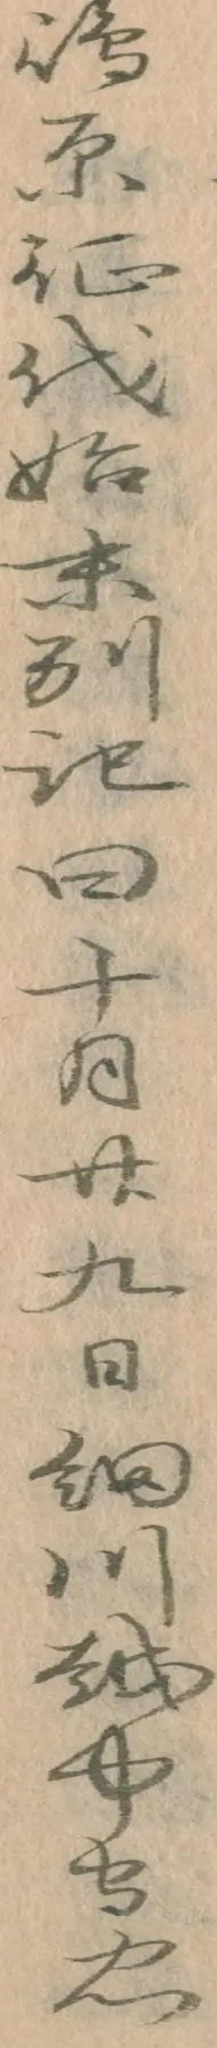島原征伐始末別記曰十月廿九日細川越中守忠
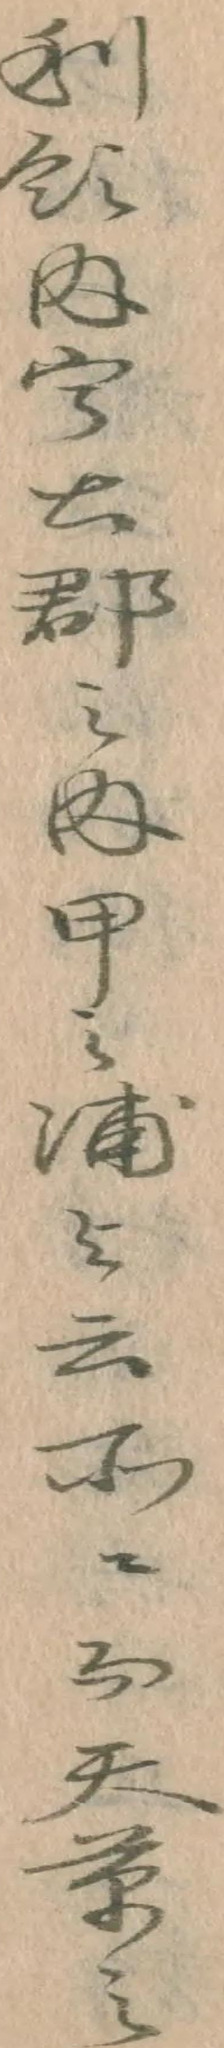利領内宇土郡之内甲之浦与云所に而天草之
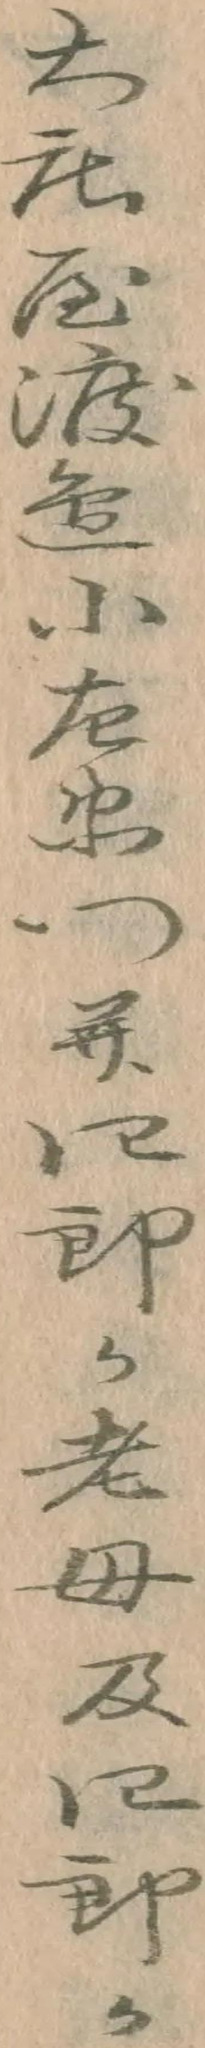大庄屋渡辺小左衛門幷四郎か老母及四郎か
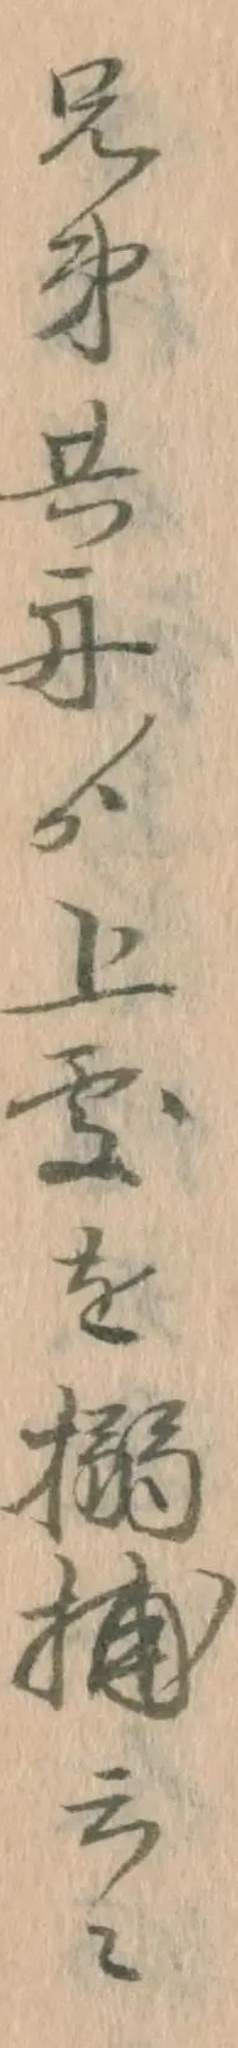兄弟共舟ゟ上処を搦捕云々
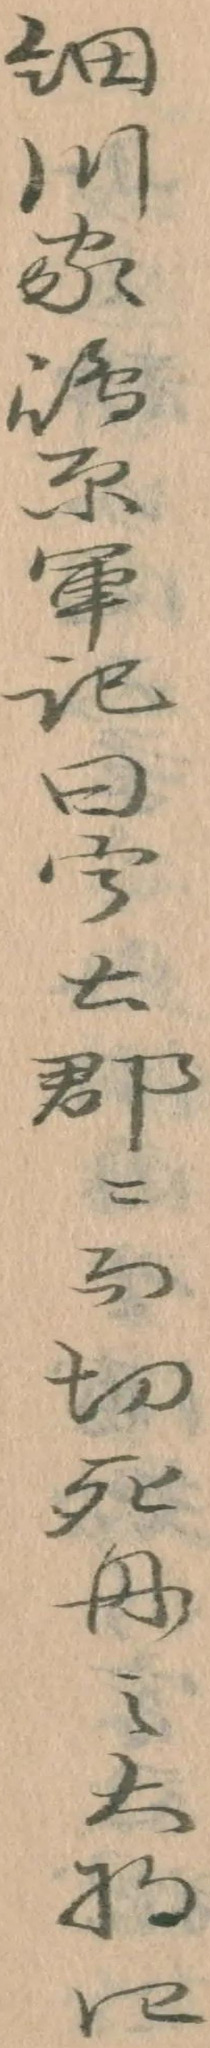細川家島原軍記曰宇土郡に而切死丹之大将四
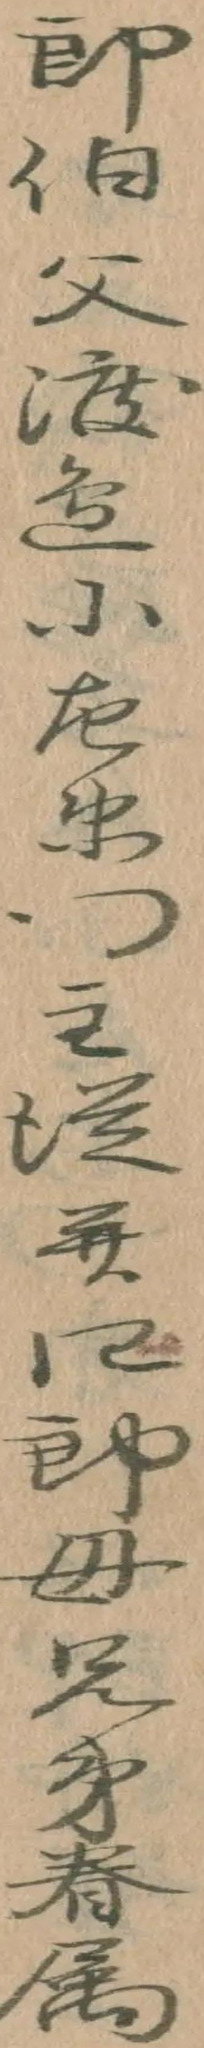郎伯父渡辺小左衛門主従幷四郎母兄弟脊属
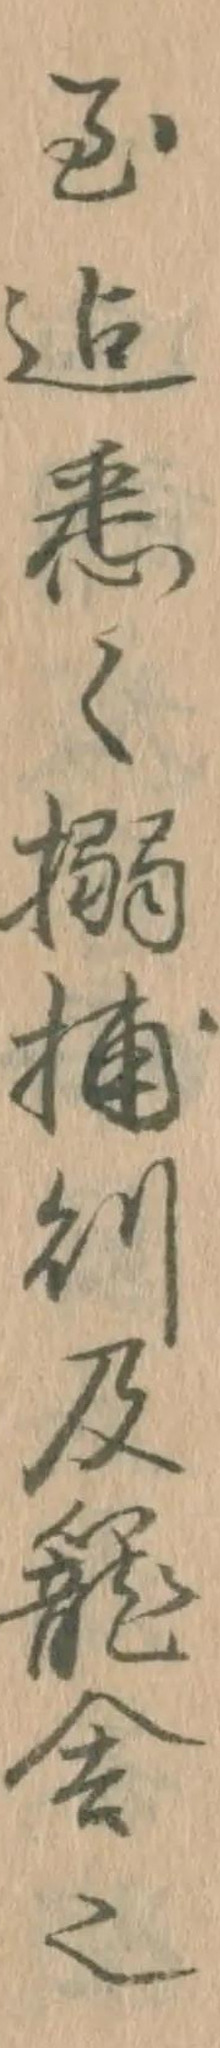至迄悉く搦捕則及籠舎也
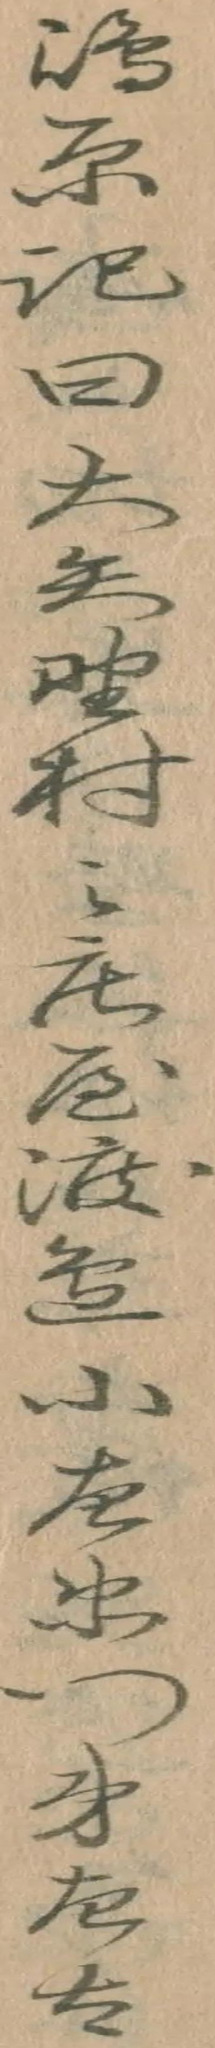島原記曰大矢野村之庄屋渡辺小左衛門弟左太
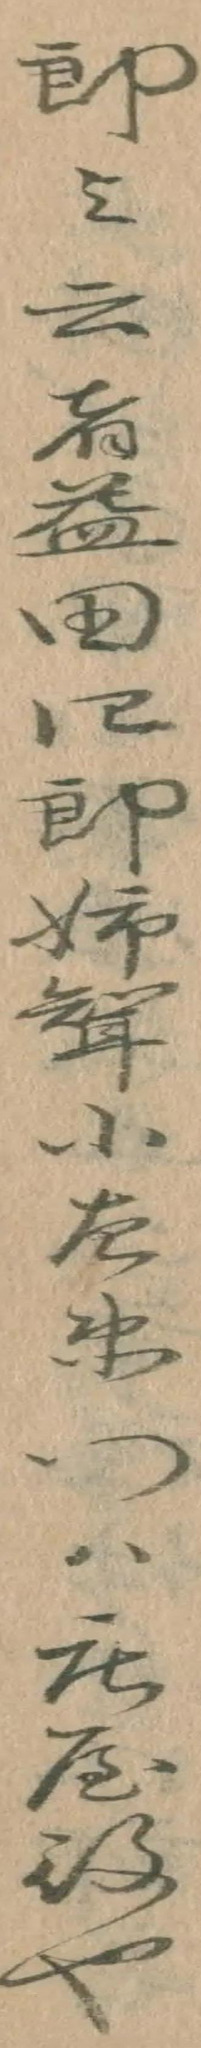郎与云者益田四郎姉聟小左衛門は庄屋役也
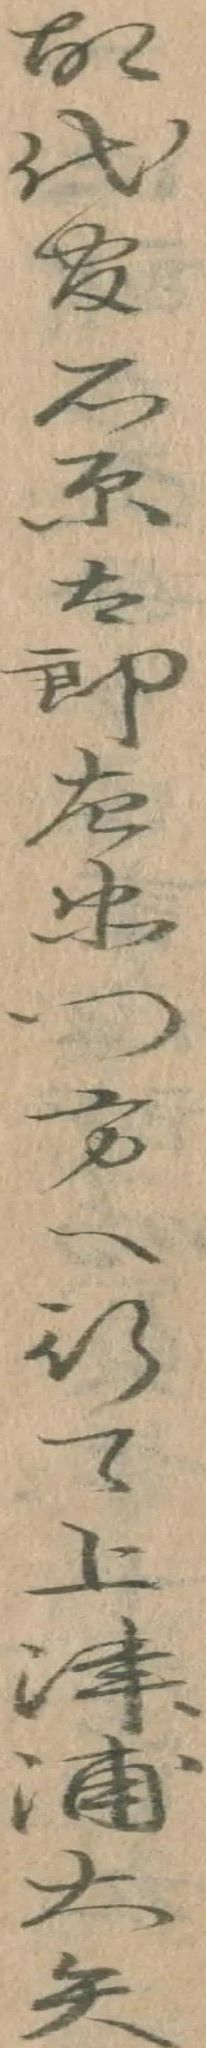故代官石原太郎左衛門方へ行て上津浦大矢
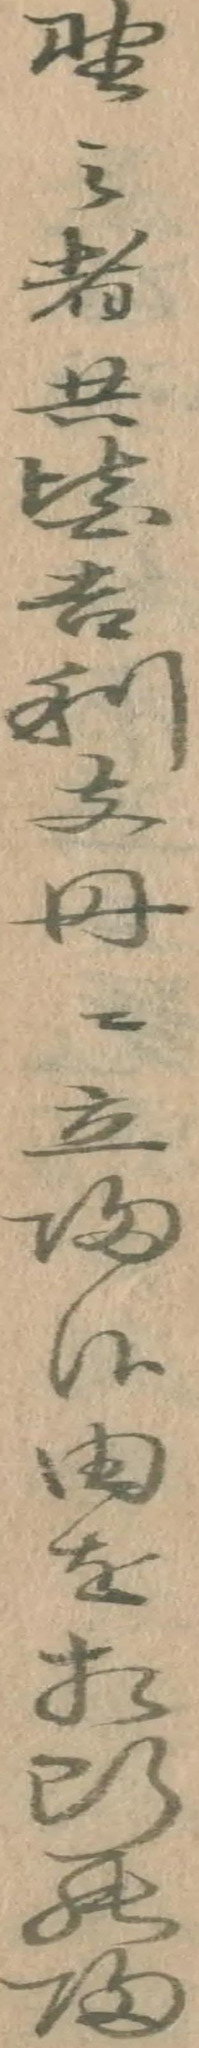野之者共皆吉利支丹に立帰候由を相改罷帰
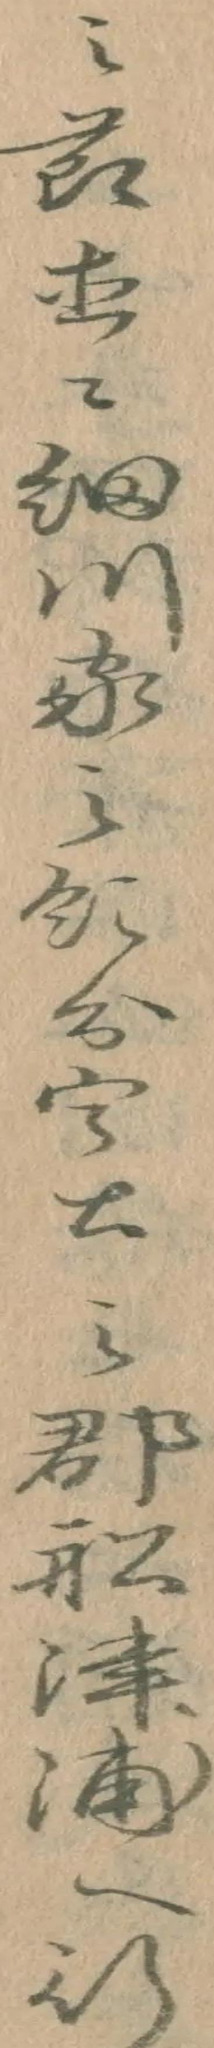之節直に細川家之領分宇土之郡舩津浦へ行
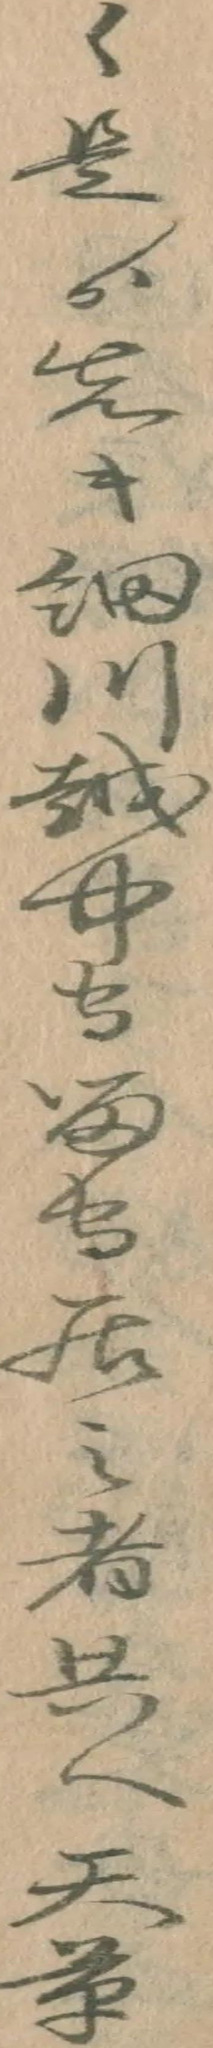く是ゟ先き細川越中守留守居之者共へ天草
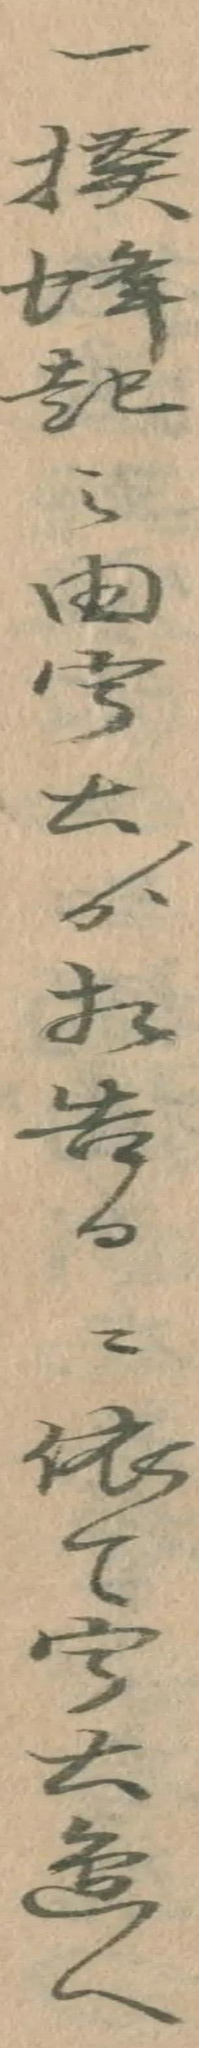一揆蜂起之由宇土ゟ相告るに依て宇土辺へ
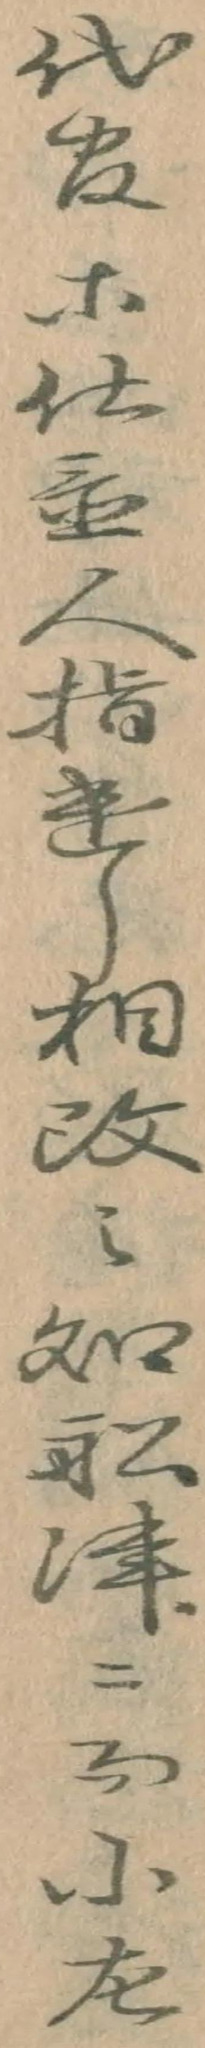代官等仕置人指遣し相改之処舩津に而小左

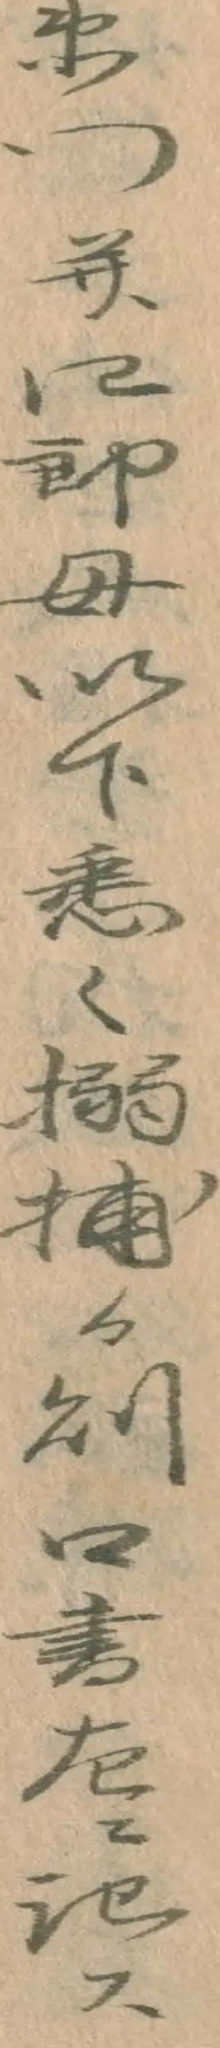衛門幷四郎母以下悉く搦捕る則口書左に記す
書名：切支丹御退治記 49巻. [2]
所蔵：国立国会図書館 National Diet Library, JAPAN
